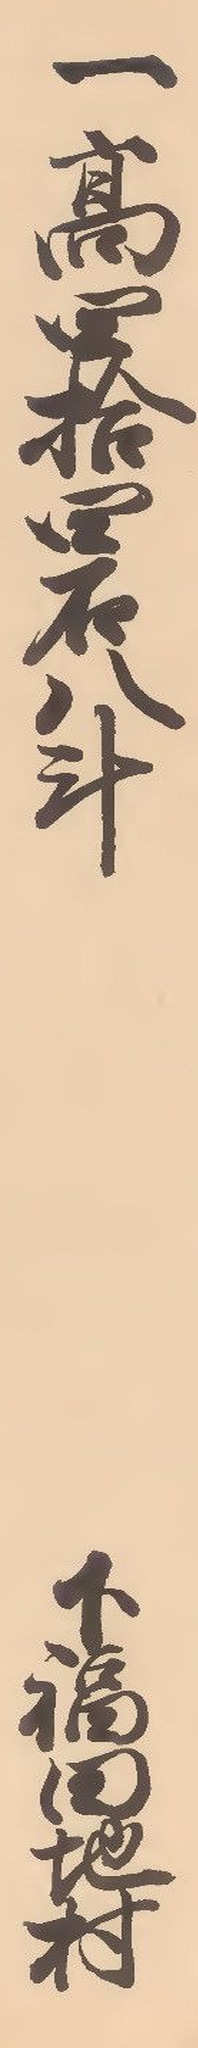一高四拾四石八斗下福田地村
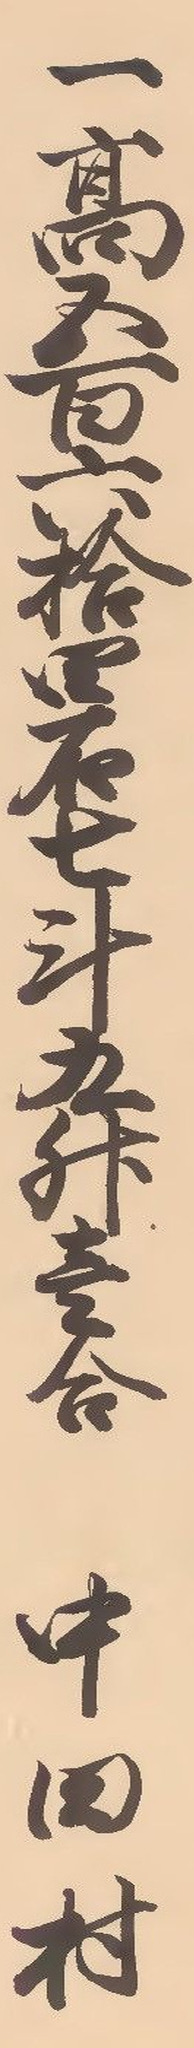一高五百六拾四石七斗九升壱合中田村
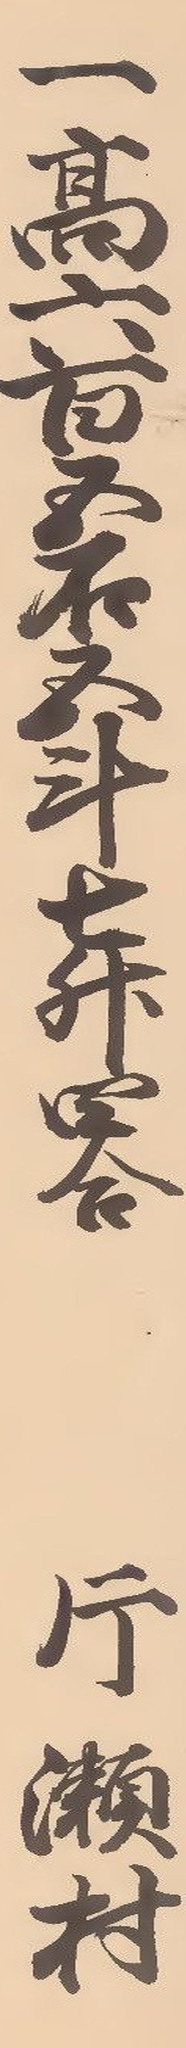一高六百五石五斗七升四合片瀬村
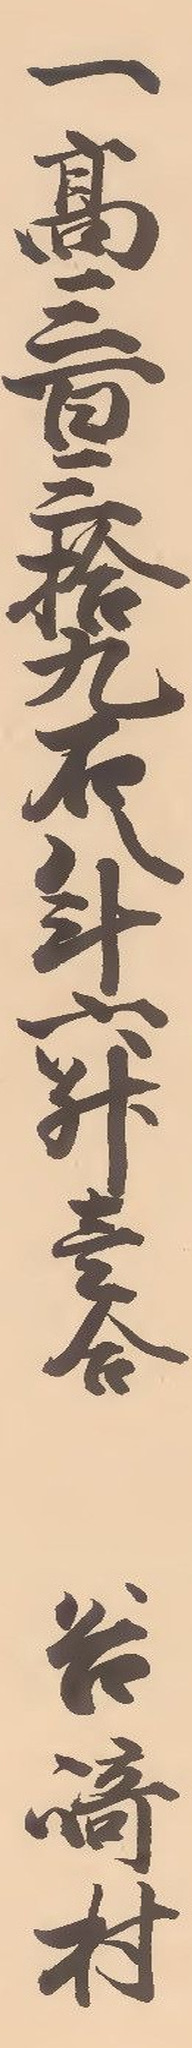一高三百三拾九石八斗六升壱合谷崎村
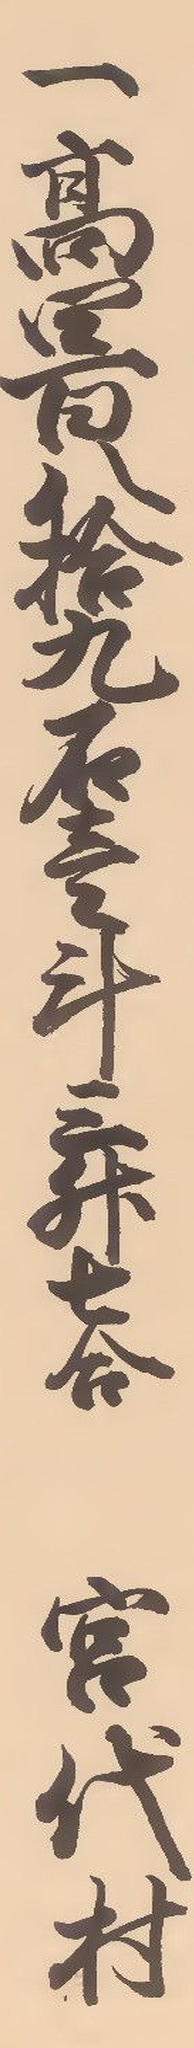一高四百八拾九石壱斗三升七合宮代村
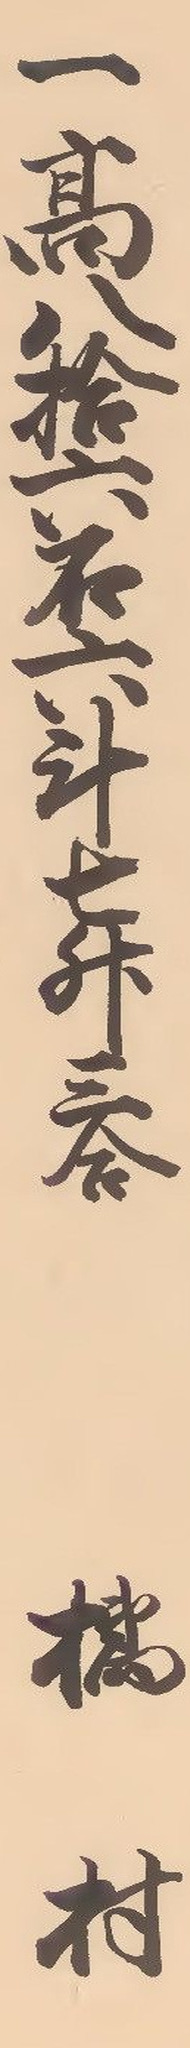一高八拾六石六斗七升三合橘村

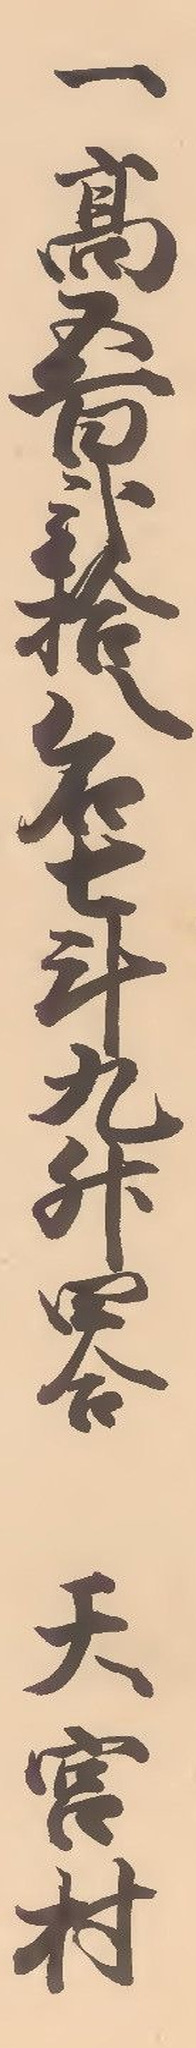一高五百弐拾八石七斗九升四合天宮村
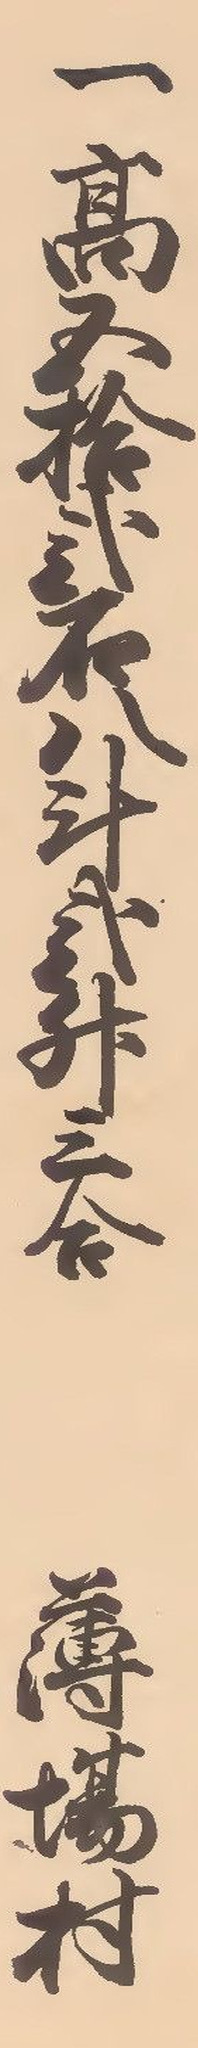一高五拾弐石八斗弐升三合薄場村
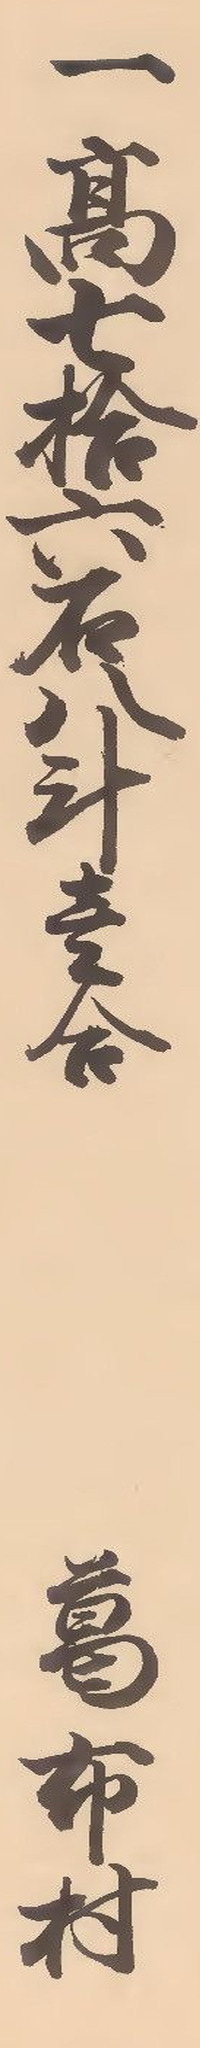一高七拾六石八斗壱合葛布村
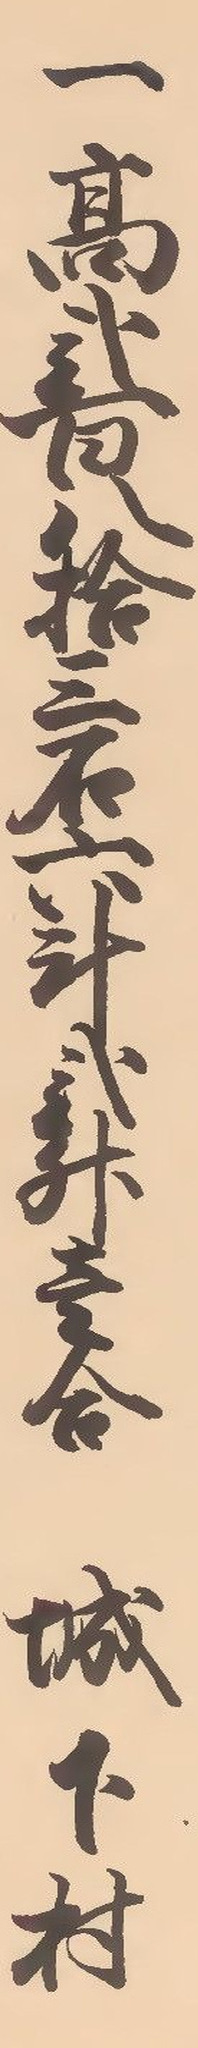一高弐百八拾三石六斗弐升壱合城下村
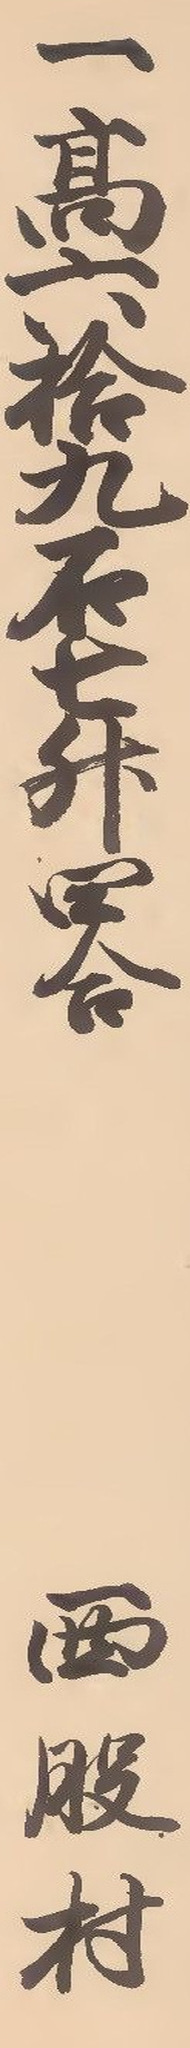一高六拾九石七升四合西股村
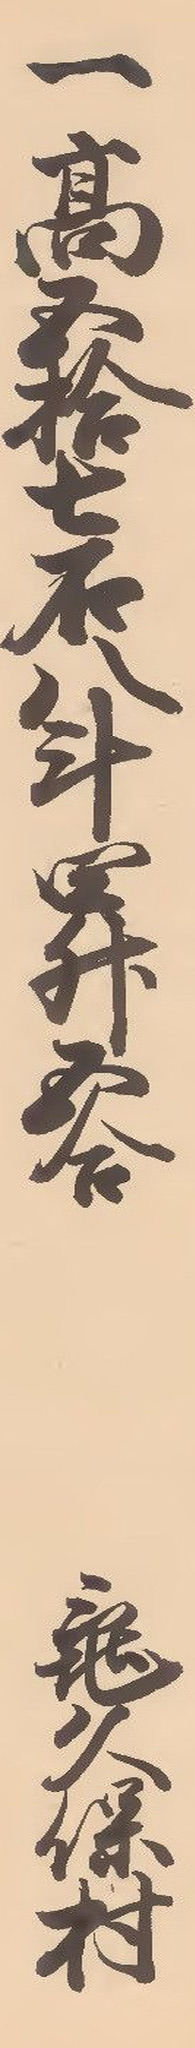一高五拾七石八斗四升五合亀久保村
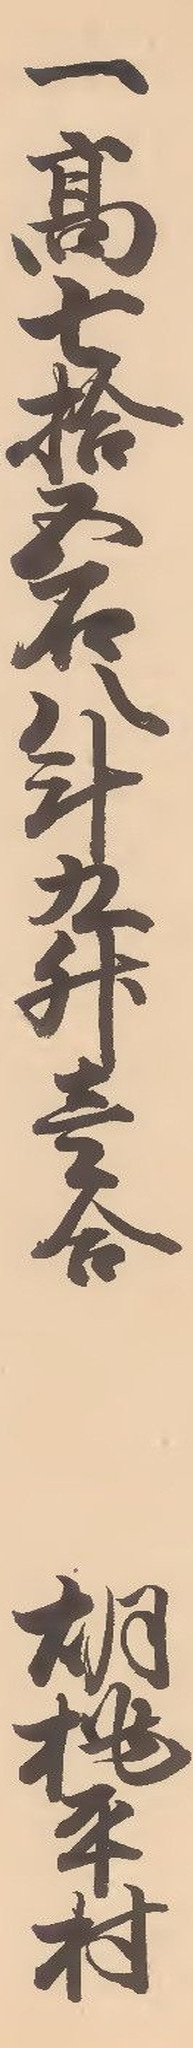一高七拾五石八斗九升壱合胡桃平村
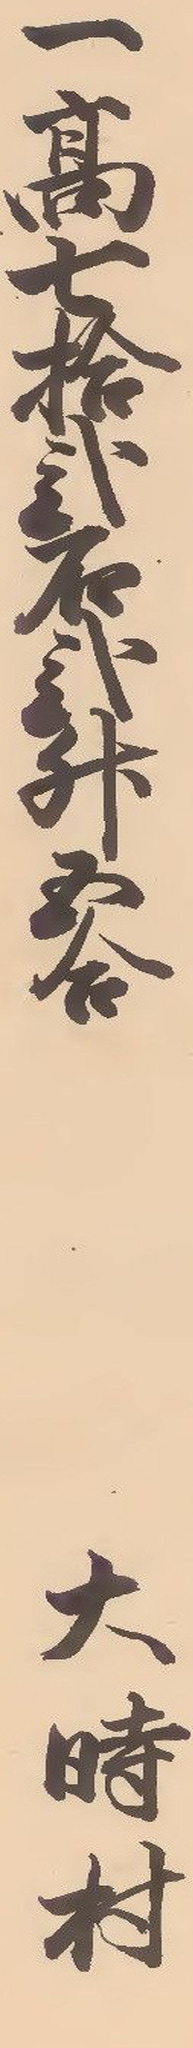一高七拾弐石弐升五合大時村

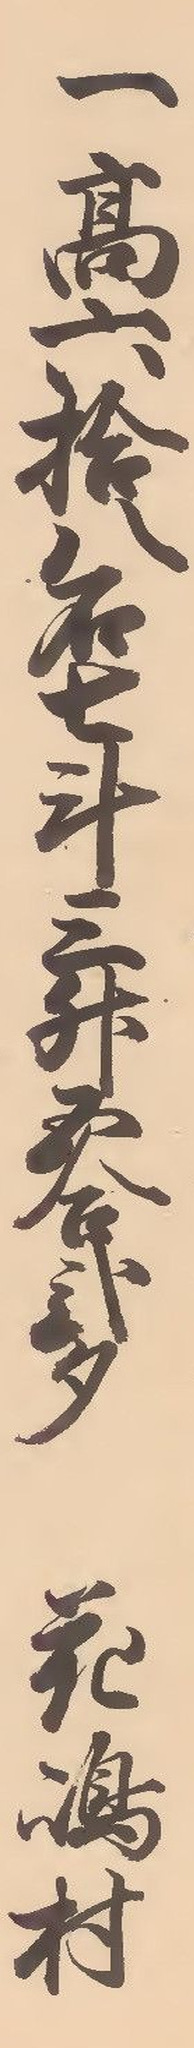一高六拾八石七斗三升五合弐勺花島村
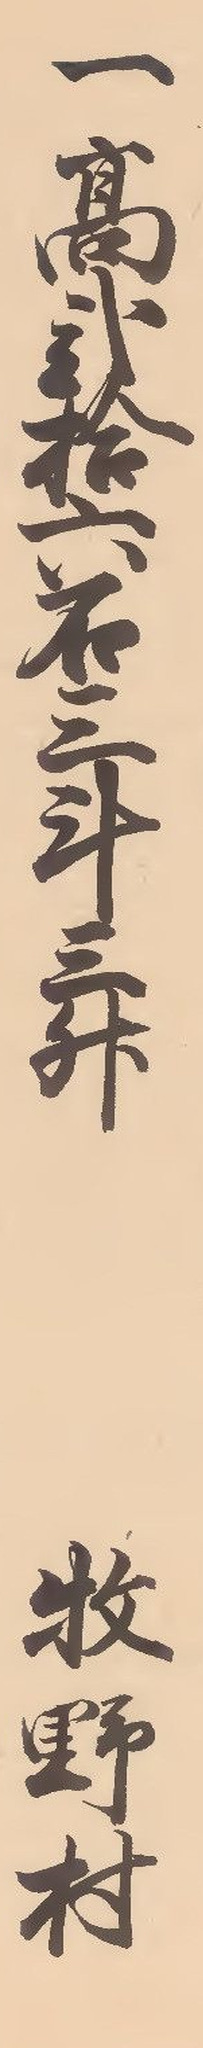一高弐拾六石三斗三升牧野村
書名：遠江国郷帳
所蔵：国立公文書館 National Archives of Japan
